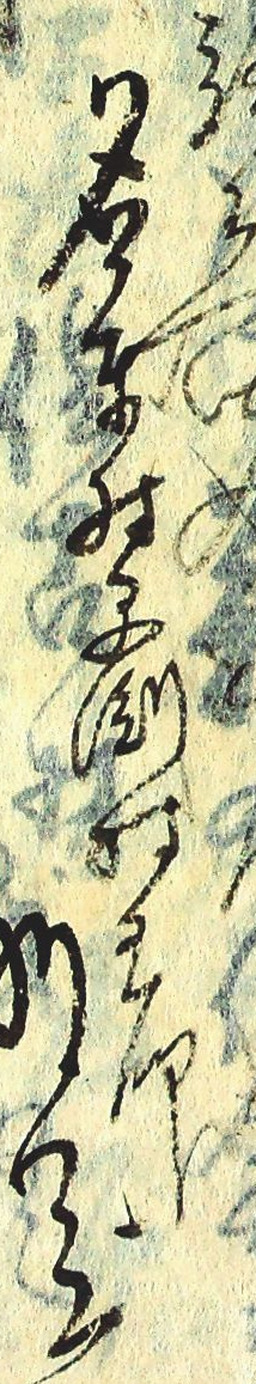名東村早淵村玉師
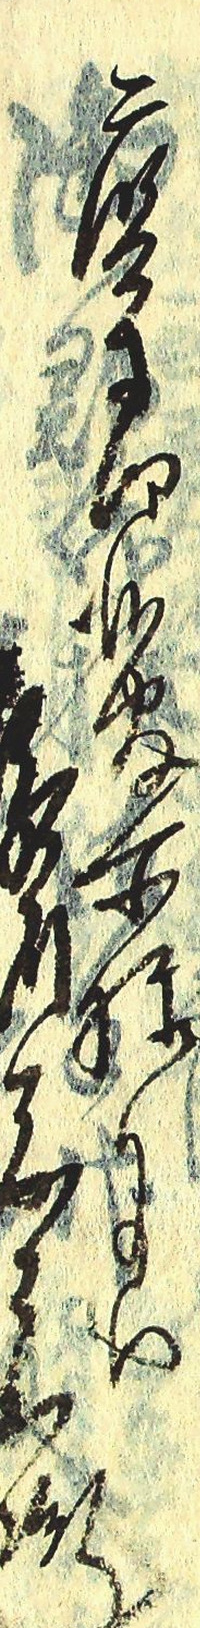藍方御代官所様御手代
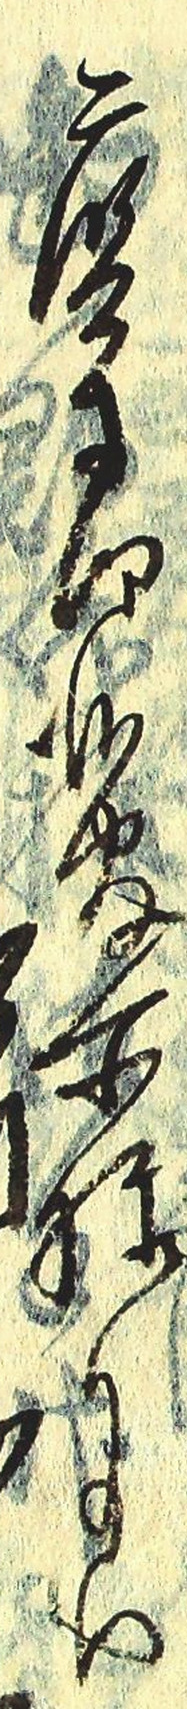藍方御代官所様御手代
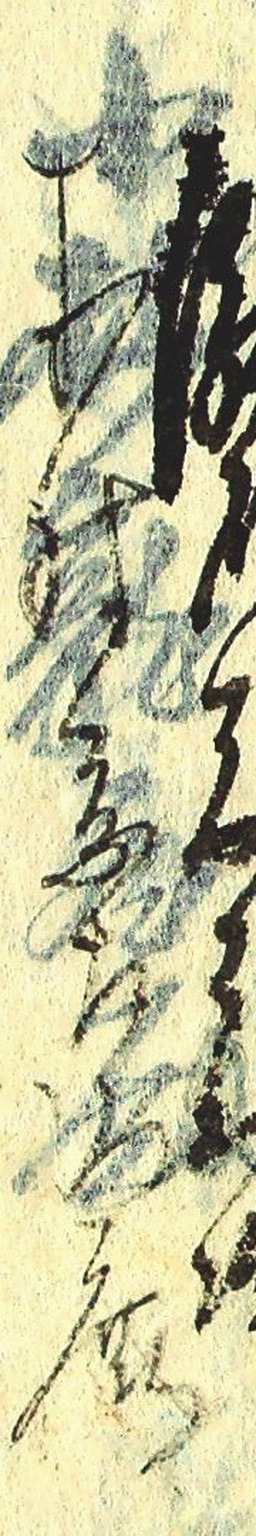木村円左衛門殿

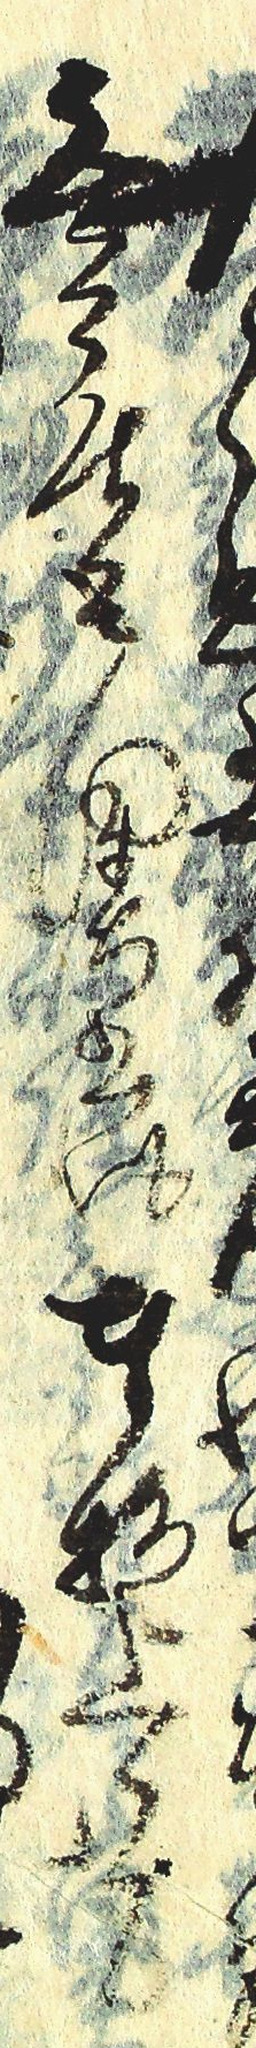無御座候付奥書仕奉指上候以上
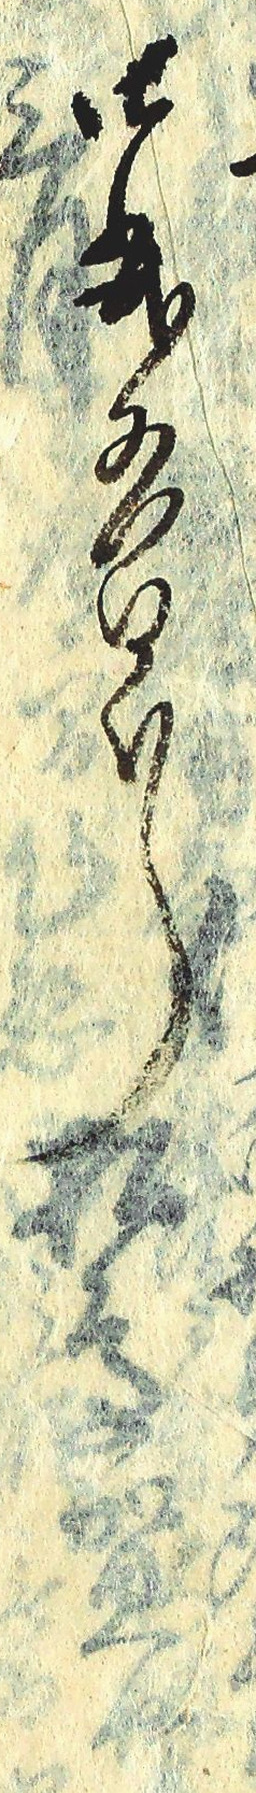御当右同断
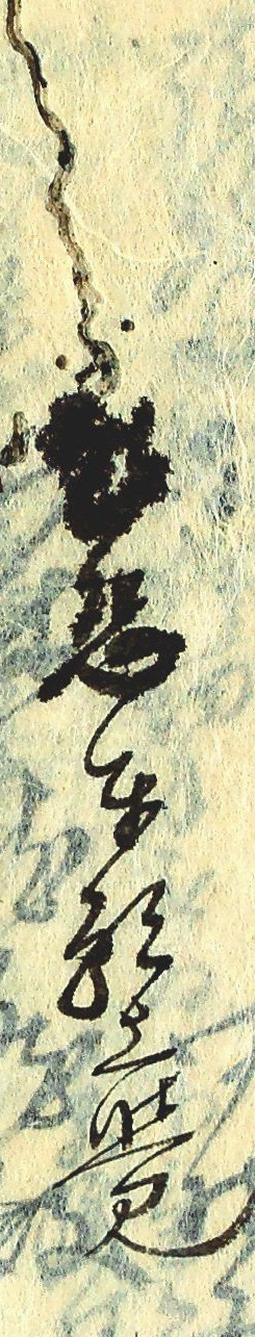乍恐奉願上覚
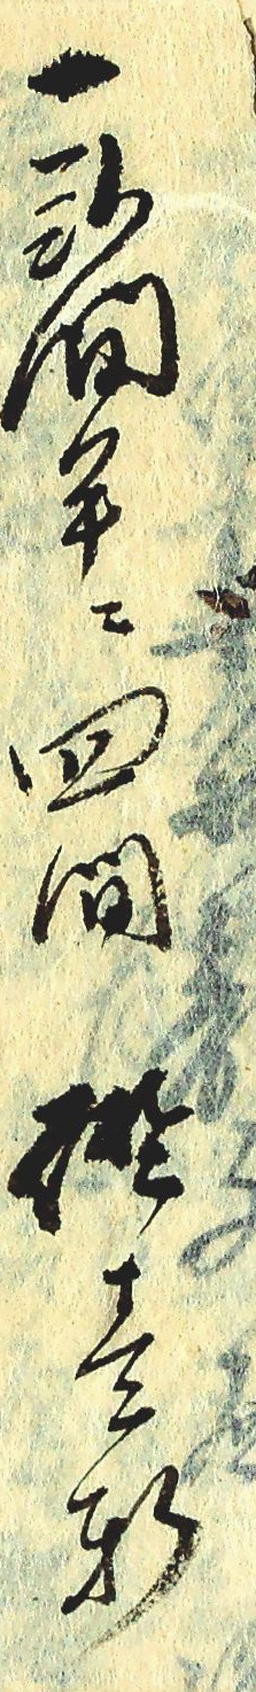一弐間半に四間礎壱軒
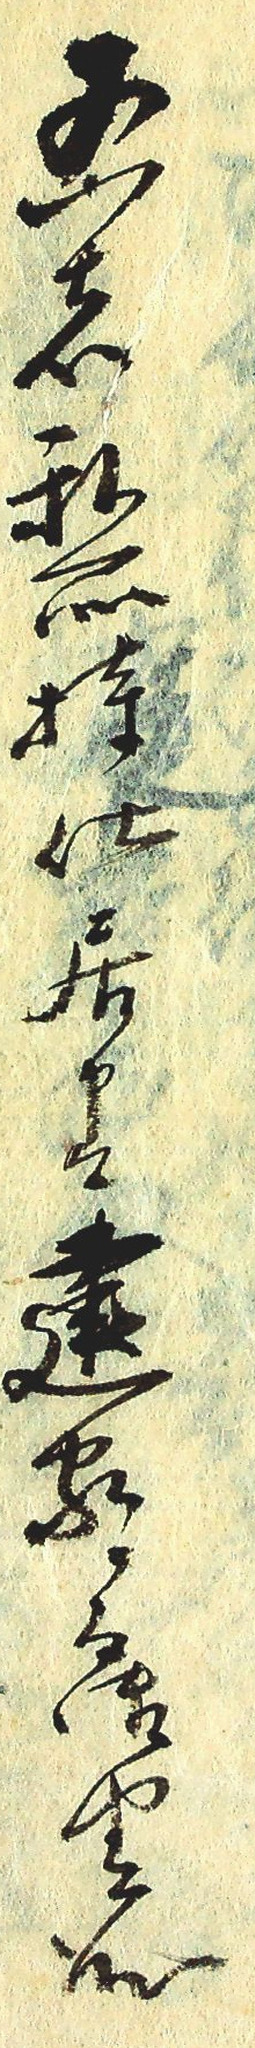右は私所持仕居申候建家にて御座候所
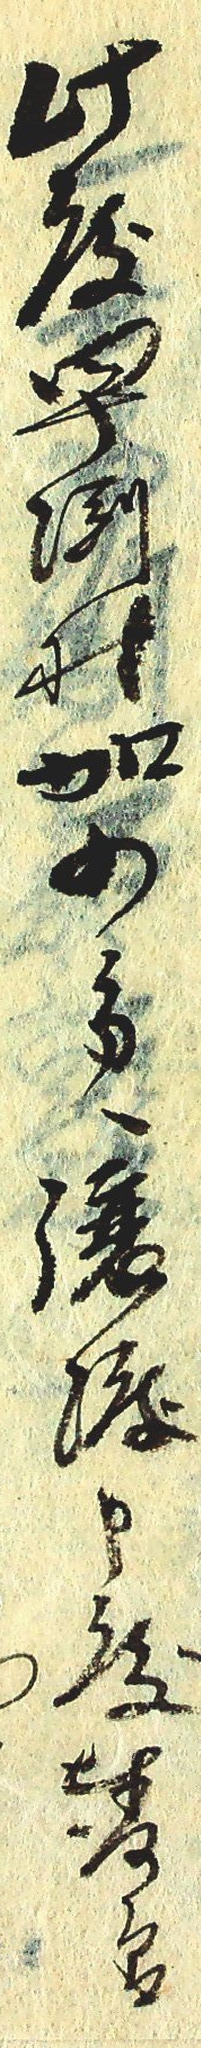此度早淵村かの方へ譲渡申度奉存候間
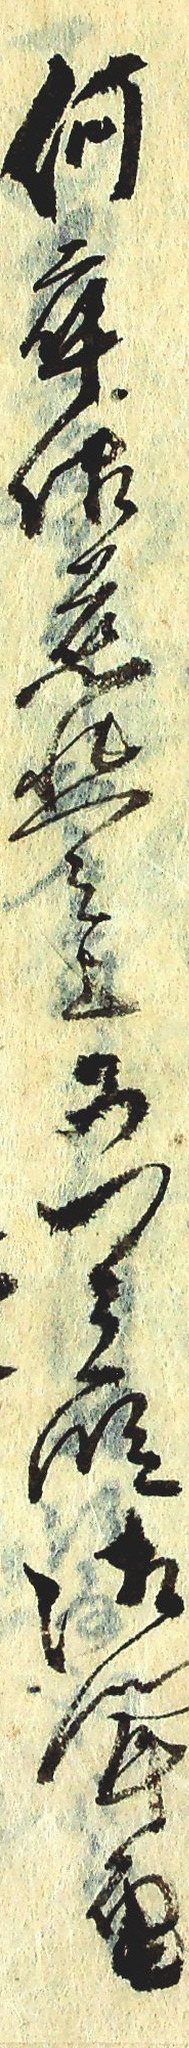何卒御慈悲之上右之段御聞届
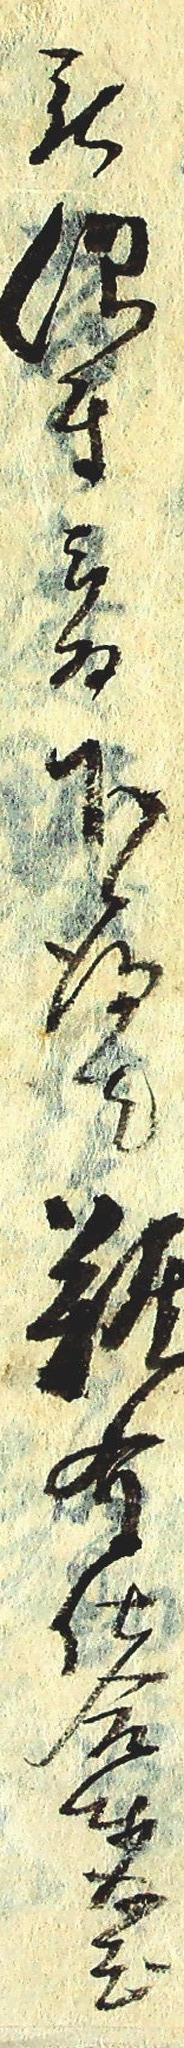被仰付被為下候得は難有仕合奉存候
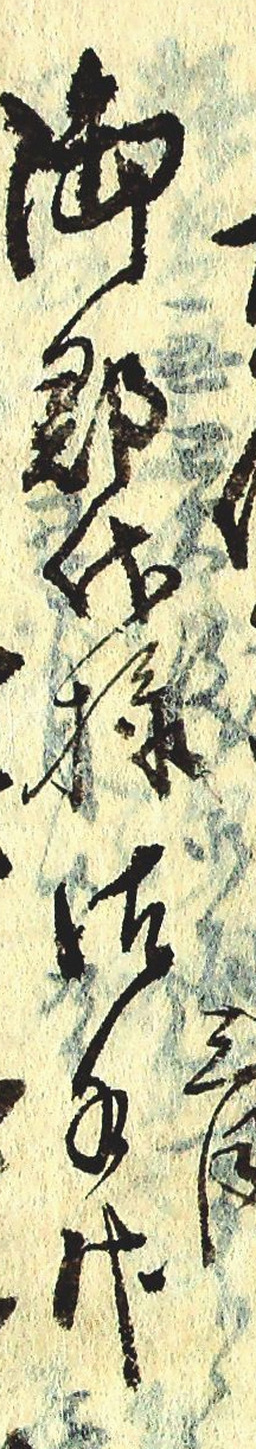御郡代様御手代
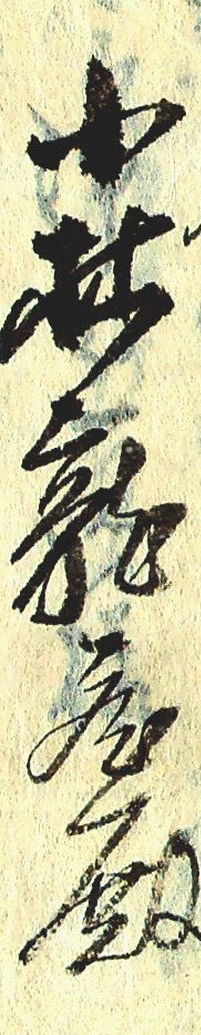小林龍蔵殿

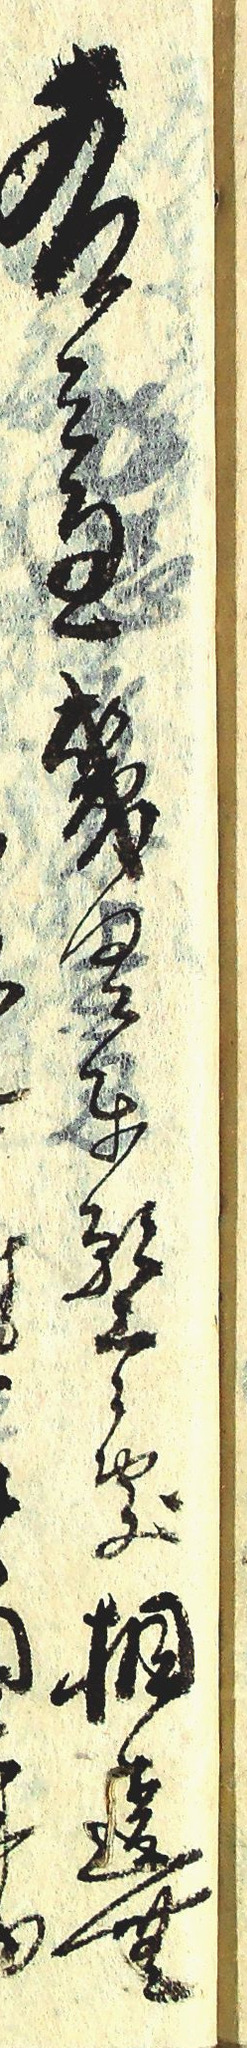右之通きく奉願上候処相違無
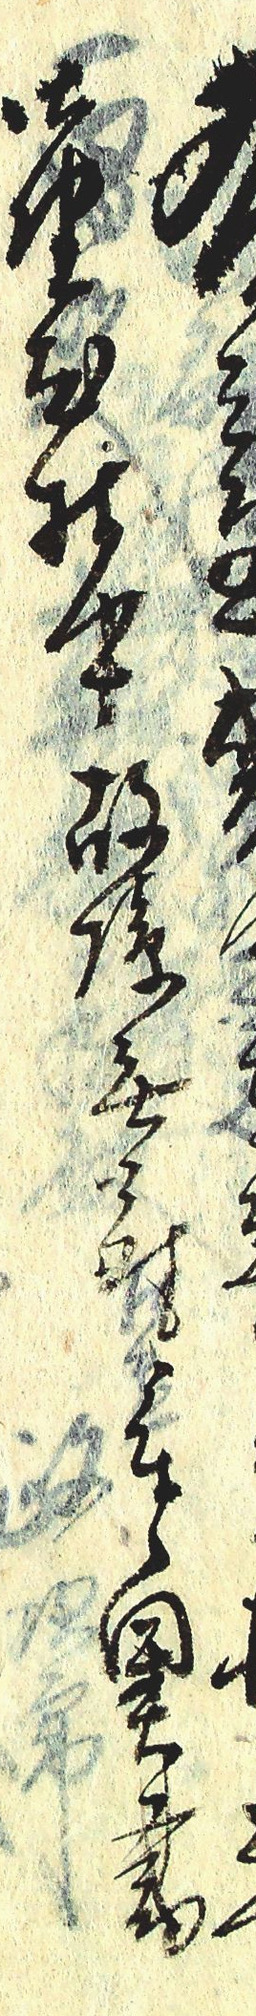御座尤村中故障無御座候に付奥書
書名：諸御願書控(弐番）
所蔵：鳴門教育大学 Naruto University of Education
